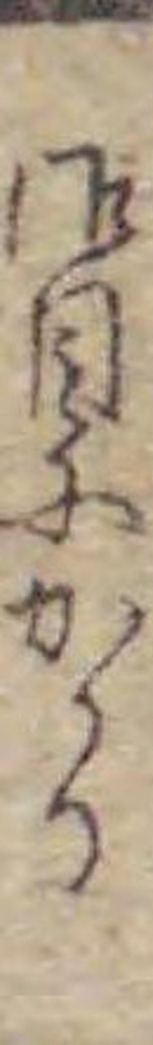御目にかゝり

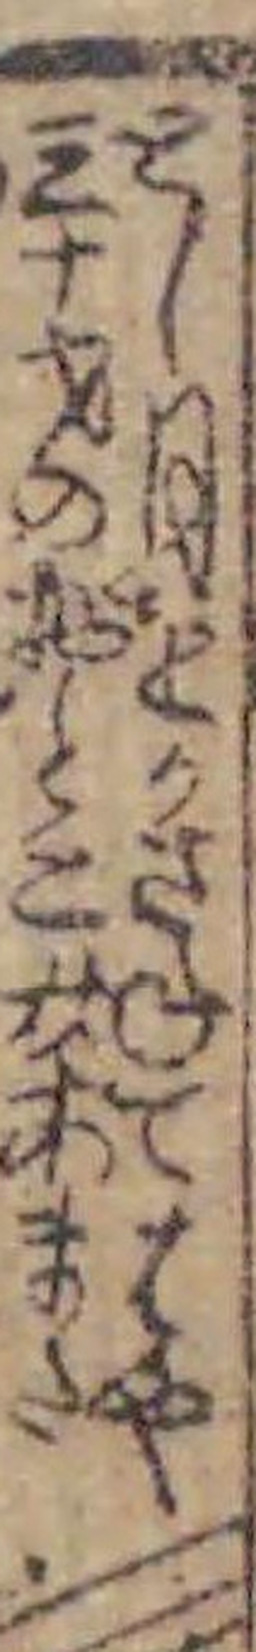三十才のおとこ女あまた
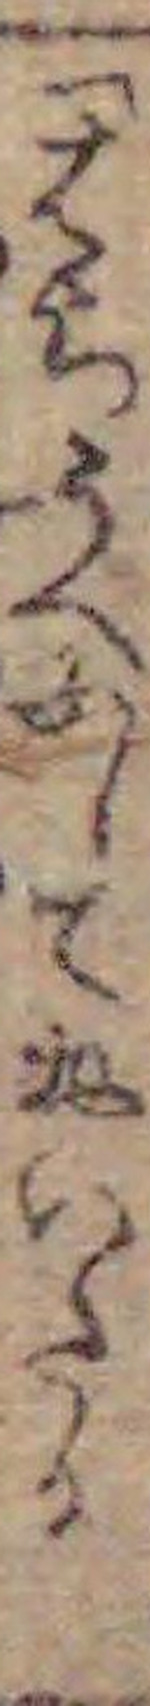〽はちうへにしておいたる
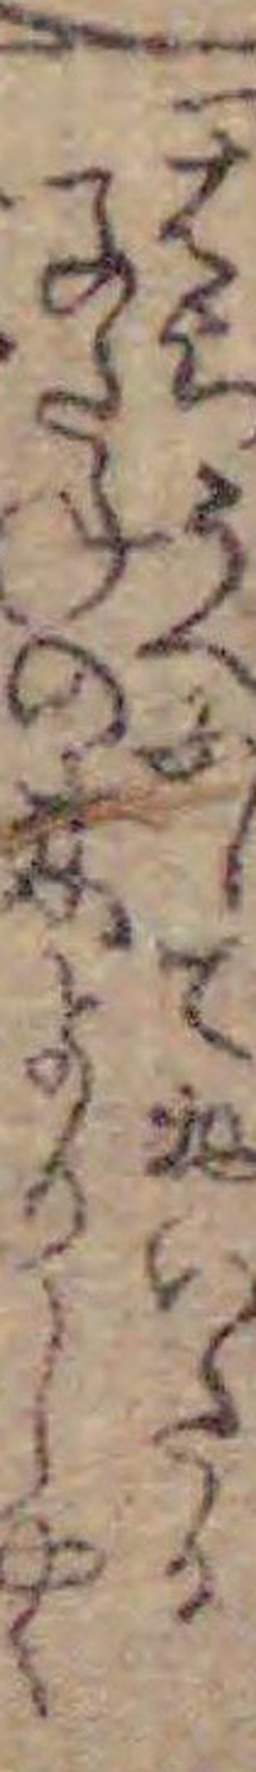子たねの木よりしやく
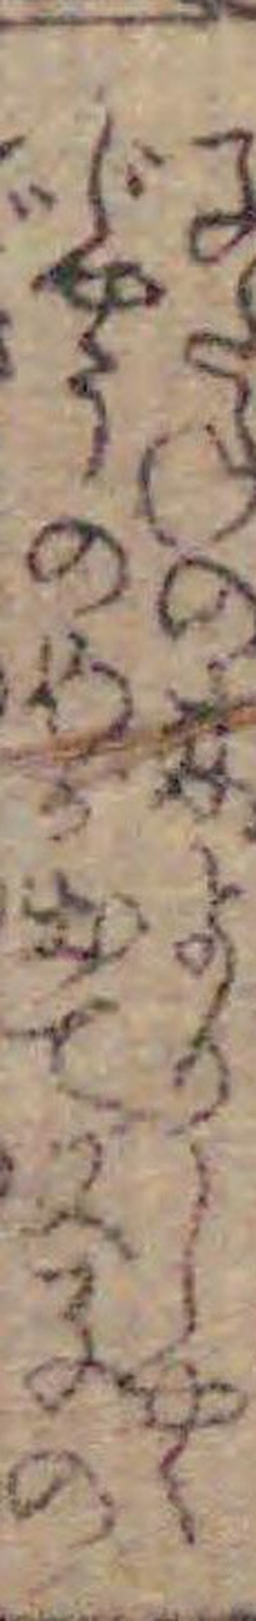じやうのめが出て又子の
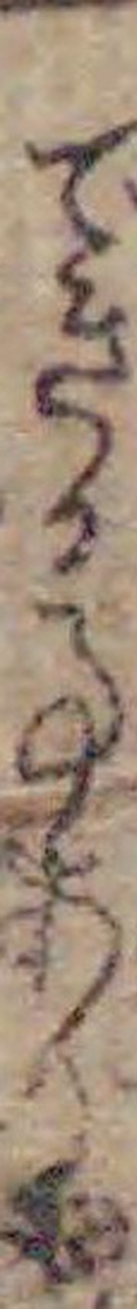できる事あり
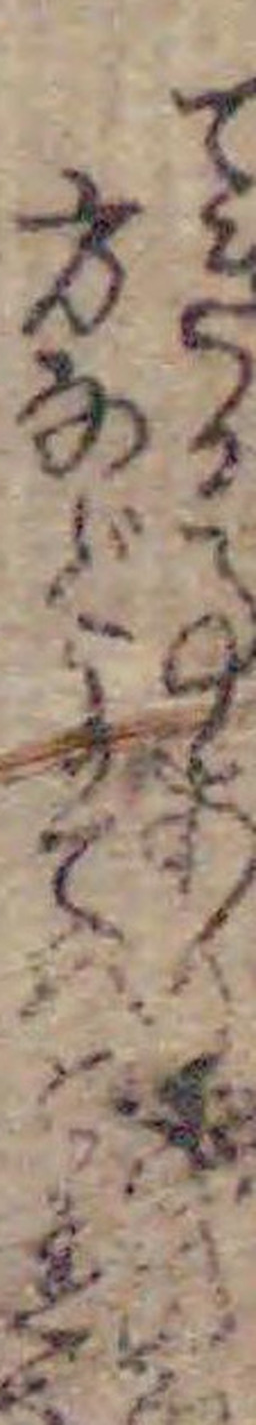方などにてはこれを
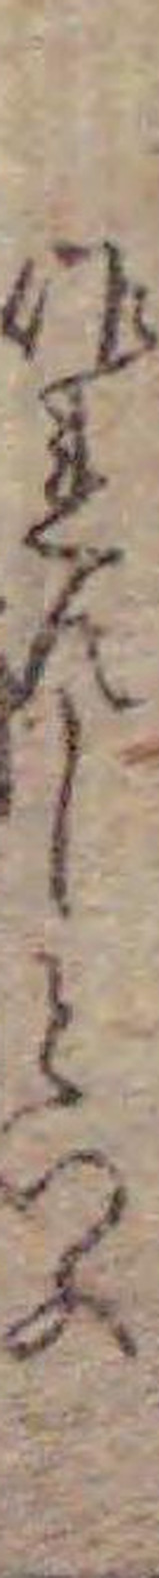御れんしといふ
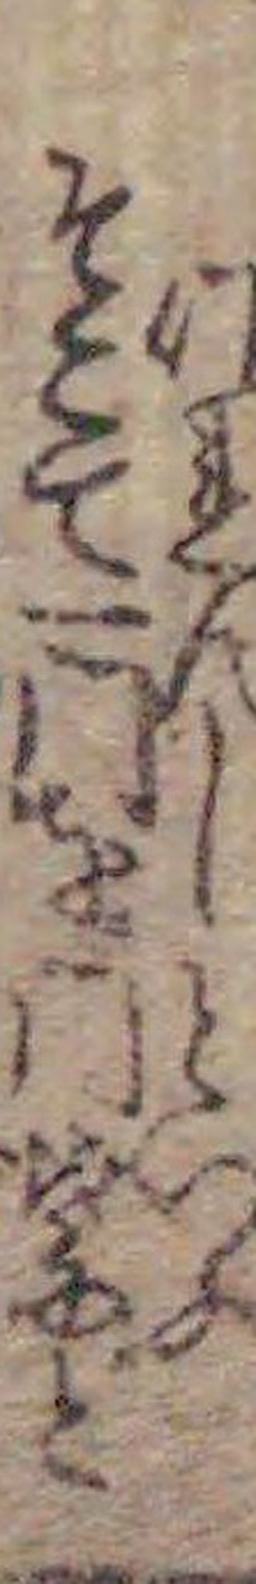そこて一文を門葉と
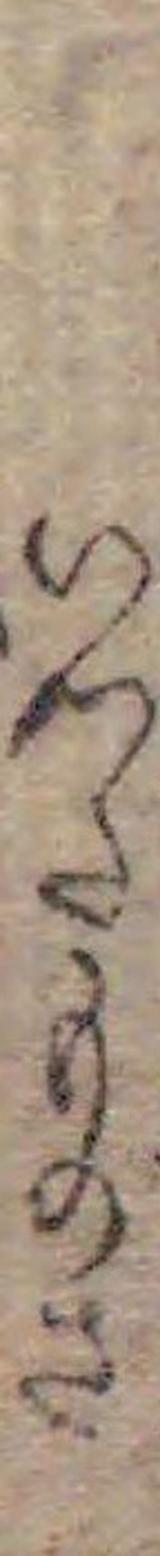いつたものさ
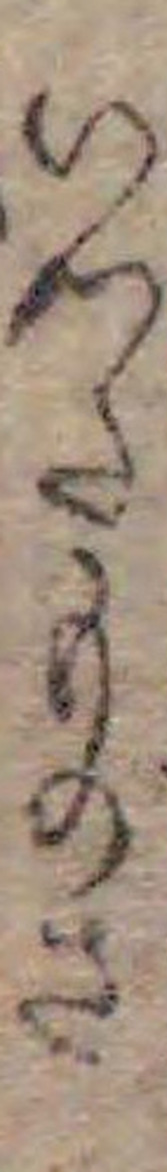いつたものさ
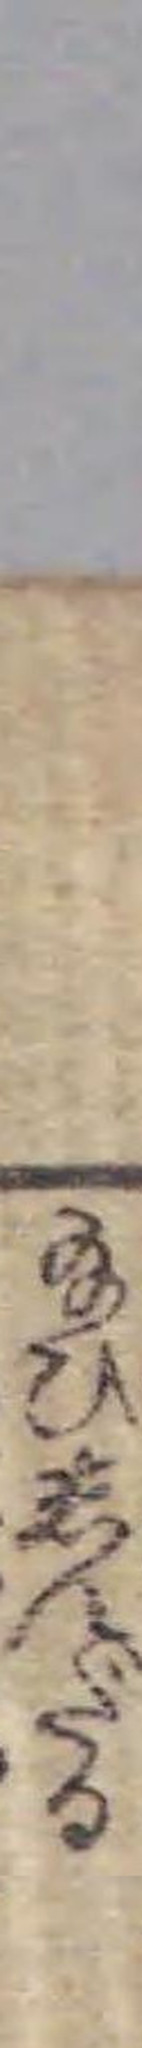給ひしんだる
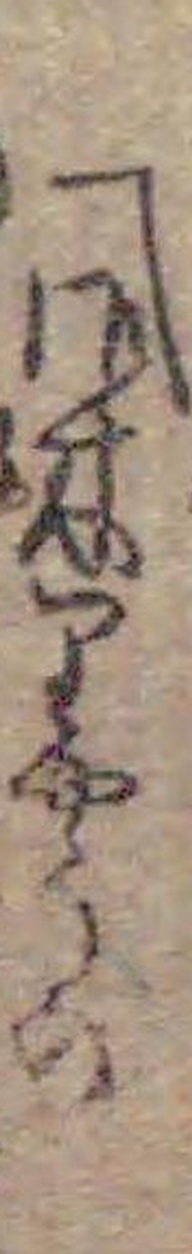〽御木りやうの
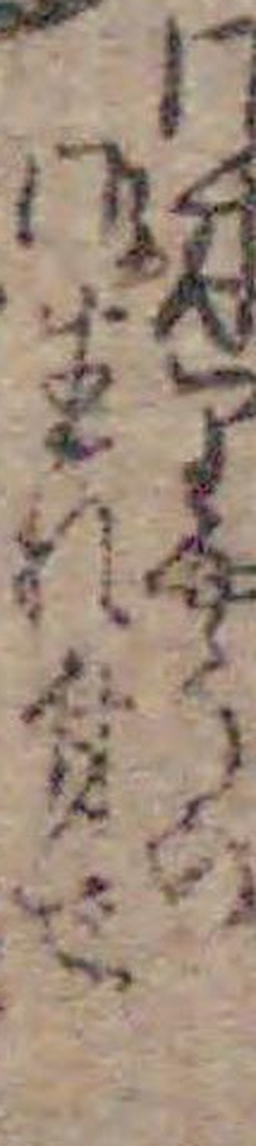御生れ付で
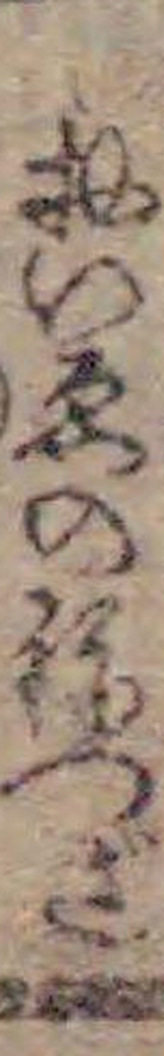おいゑのねつぎ
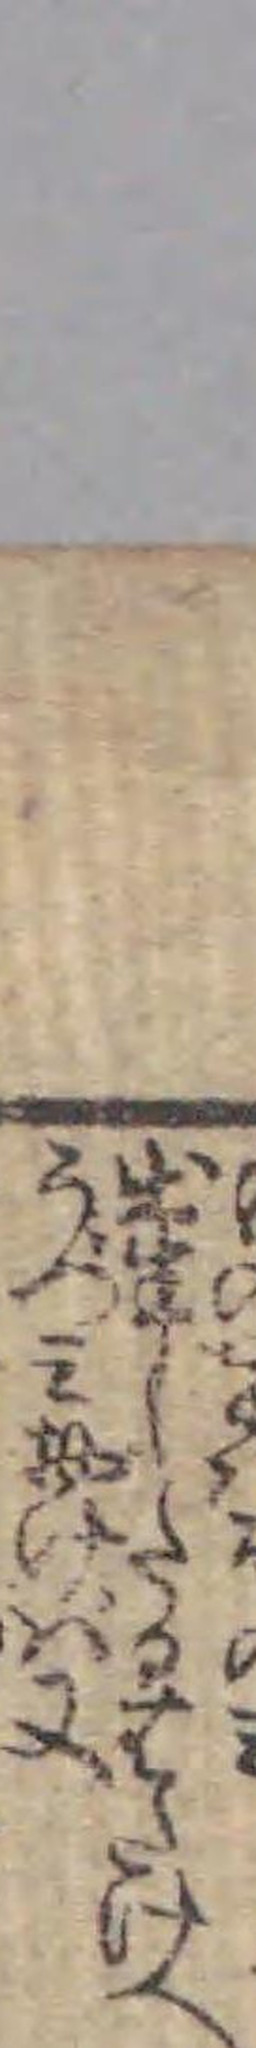うづみおけば又
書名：奇妙頂礼胎錫杖 : 3巻
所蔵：国立国会図書館 National Diet Library, JAPAN
